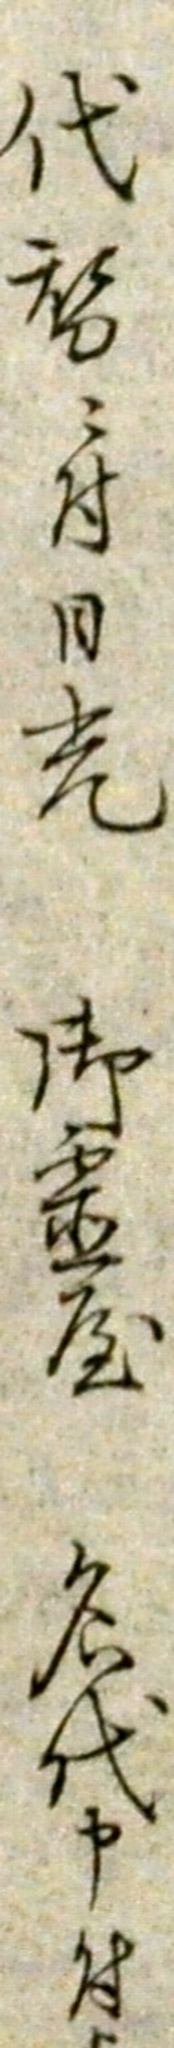代替二付日光御霊屋名代申付与
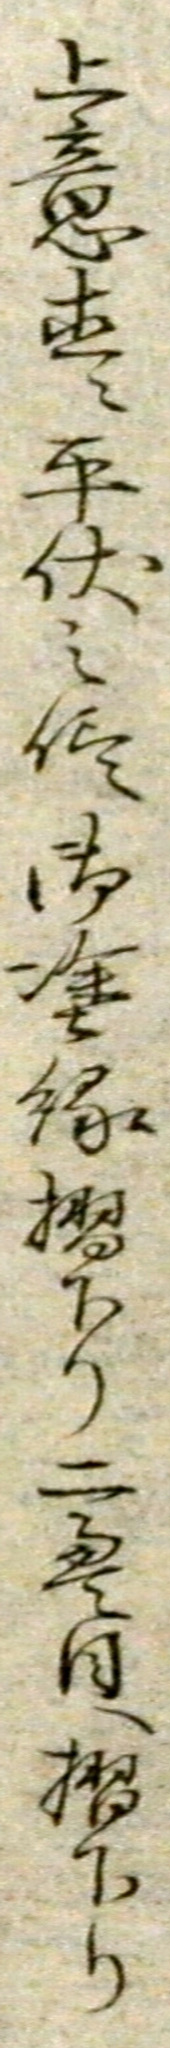上意直平伏之儘御塗縁摺下り二畳目へ摺下り
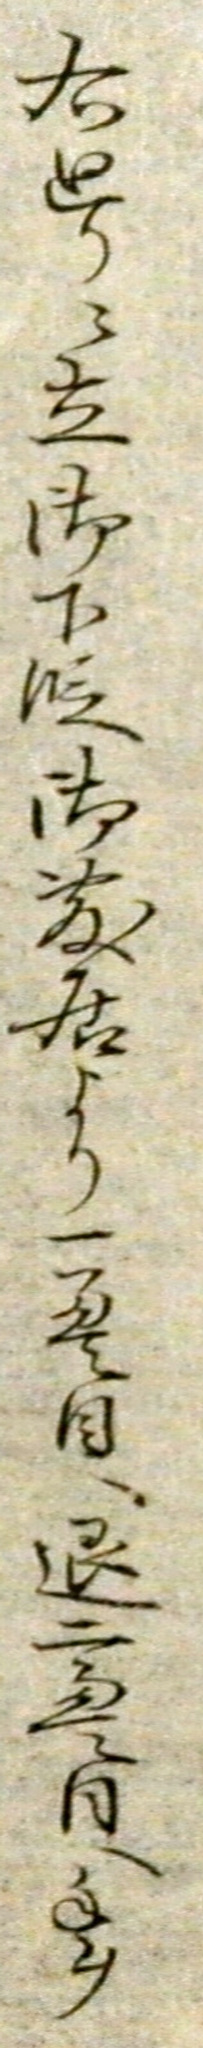右廻りニ立御下段御敷居より一畳目へ退二畳目へ手ヲ
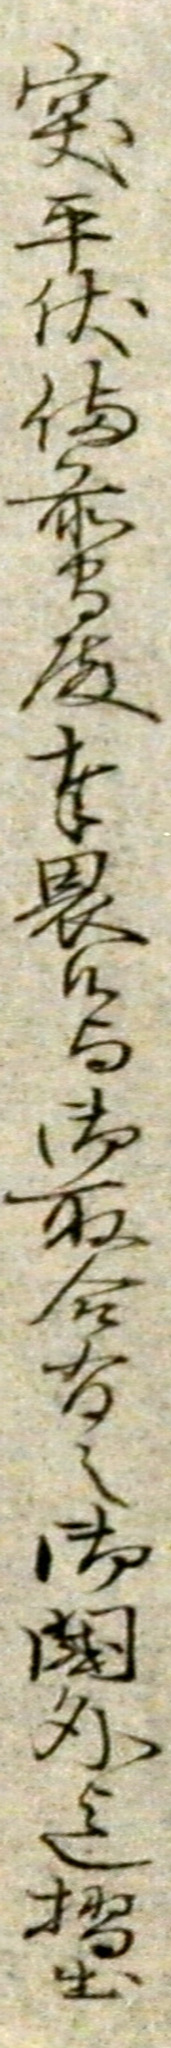突平伏備前守殿奉畏候与御取合有之御閾外迠摺出

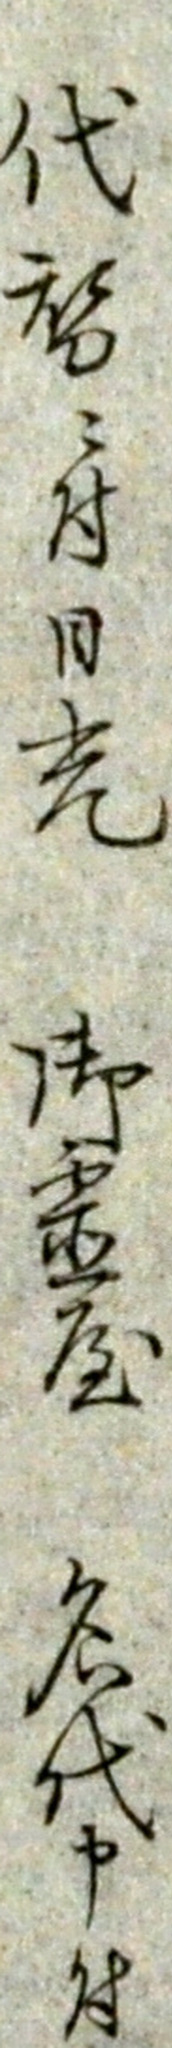代替二付日光御霊屋名代申付与
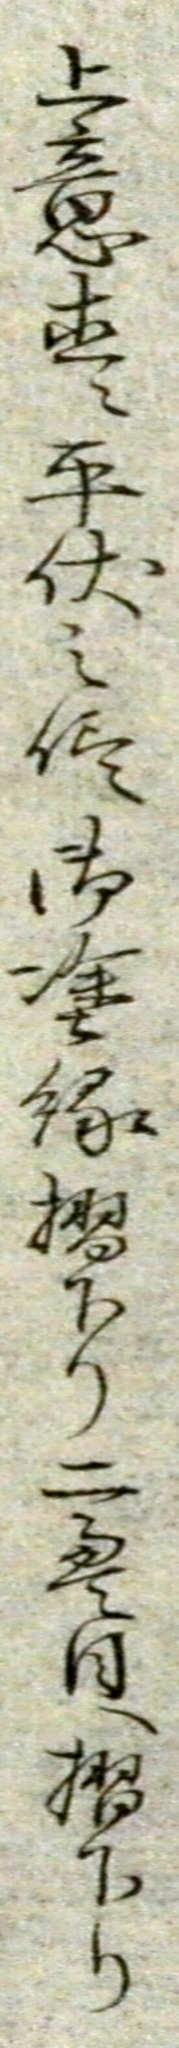上意直ニ平伏之儘御塗縁摺下り二畳目へ摺下り
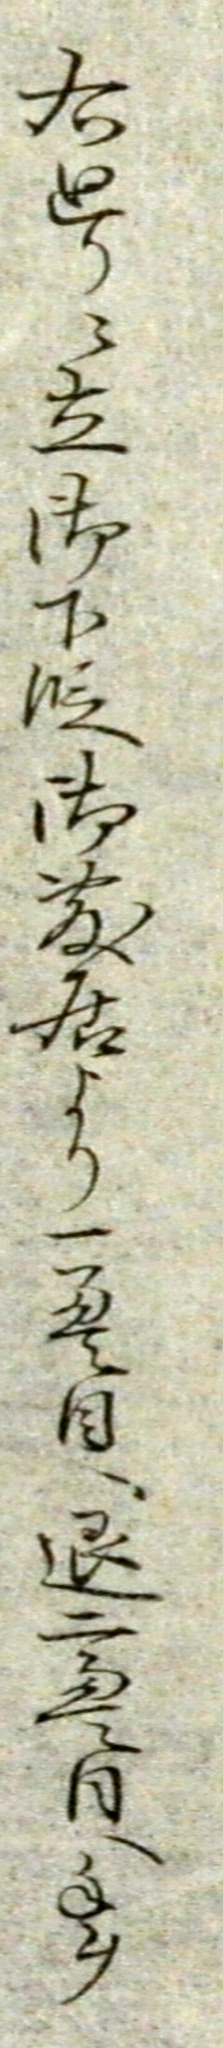右廻りニ立御下段御敷居より一畳目へ退二畳目へ手ヲ
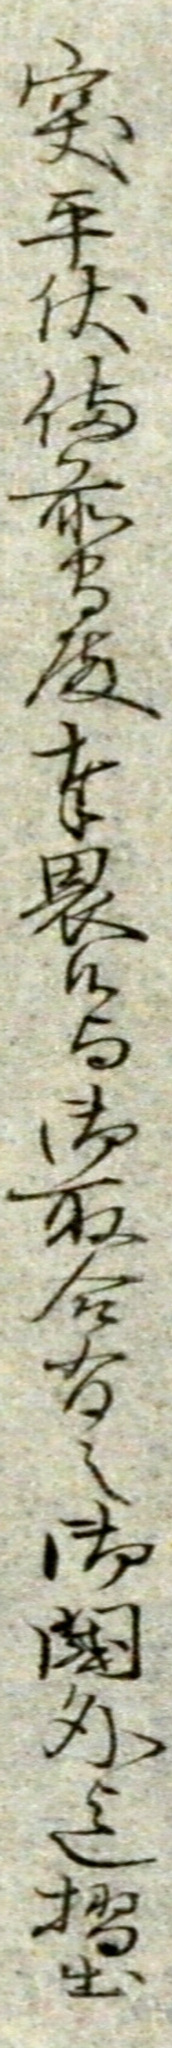突平伏備前守殿奉畏候と御取合有之御閾外迄摺出
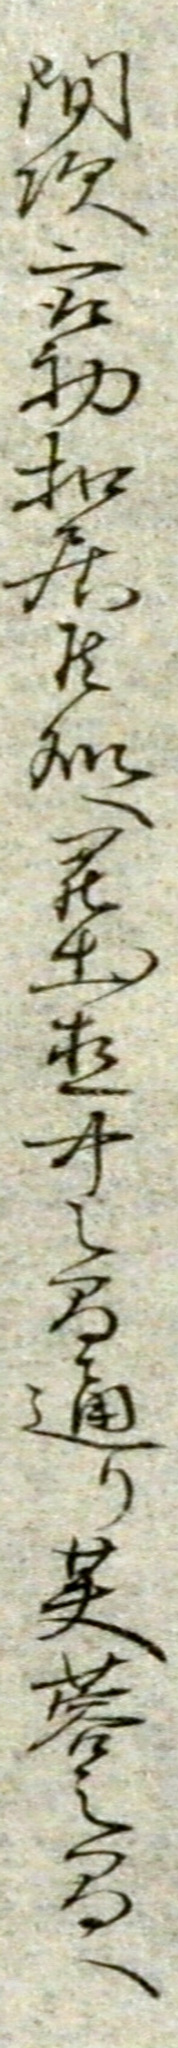間次最初候処へ罷出直中之間通り芙蓉之間へ
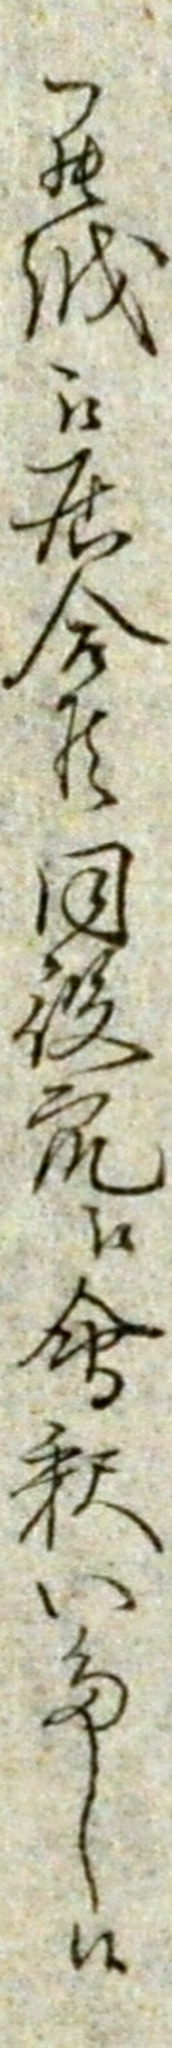罷越被居合共同役衆江会釈いたし候
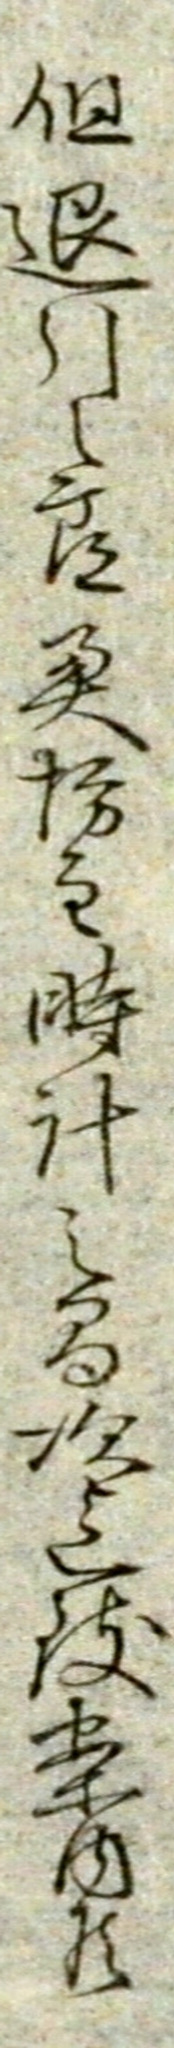但退引之節奥坊主時計之間次迄致案内候
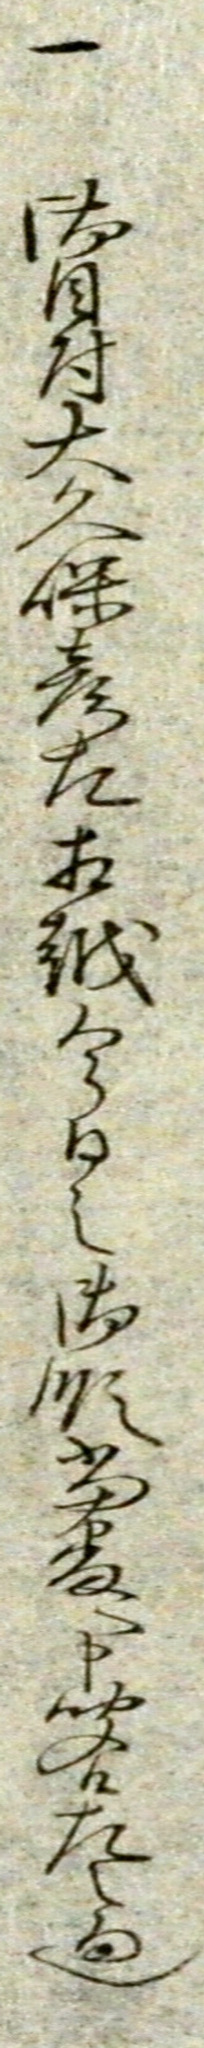一御目付大久保彦左相越今日之御順当番へ申聞候左之通
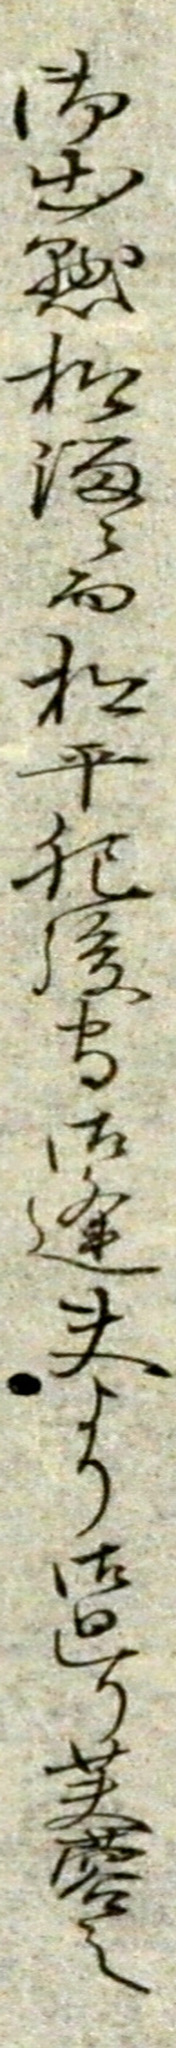御出懸扣溜ニ而松平肥後守殿御逢夫より御廻り芙蓉
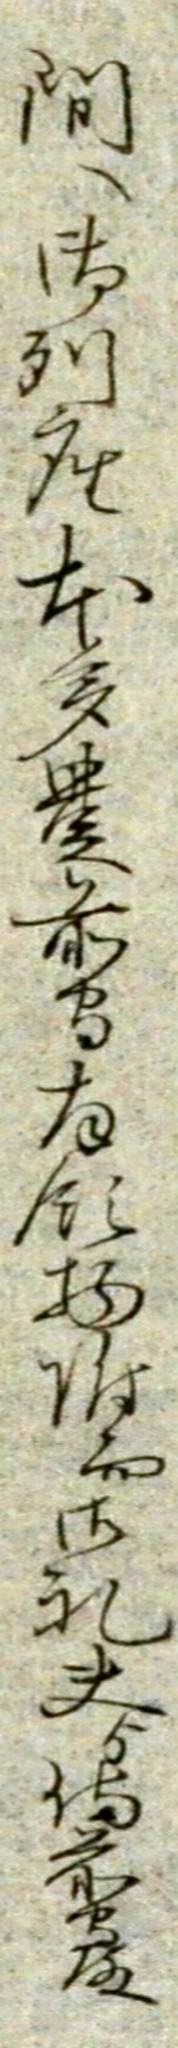之間へ御列座本多豊前守拝領物附而御礼夫ゟ備前守
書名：日光御名代相勤候節ノ留
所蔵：伊那市立高遠町図書館・合同会社AMANE
